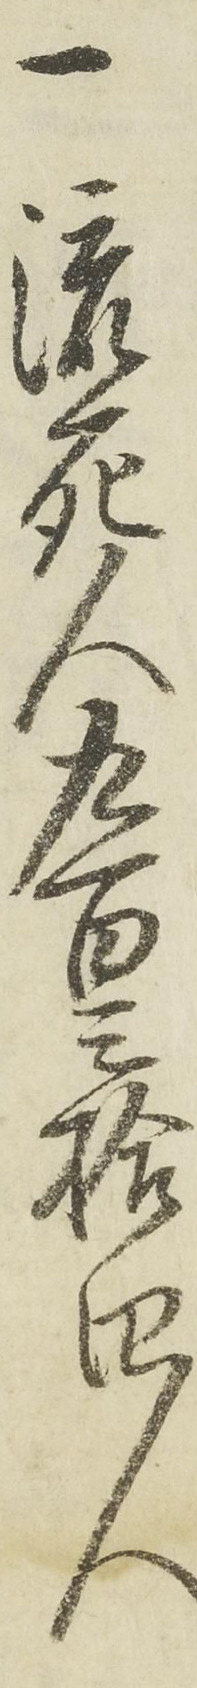一流失家九百三拾九軒
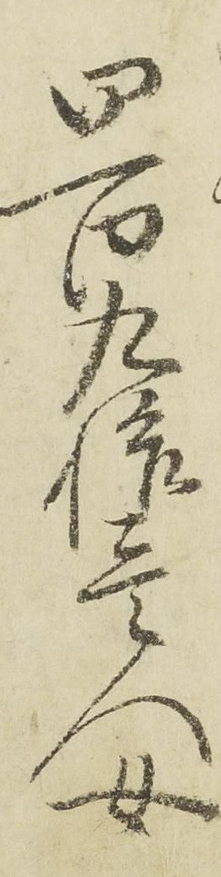内四百九拾壱人女
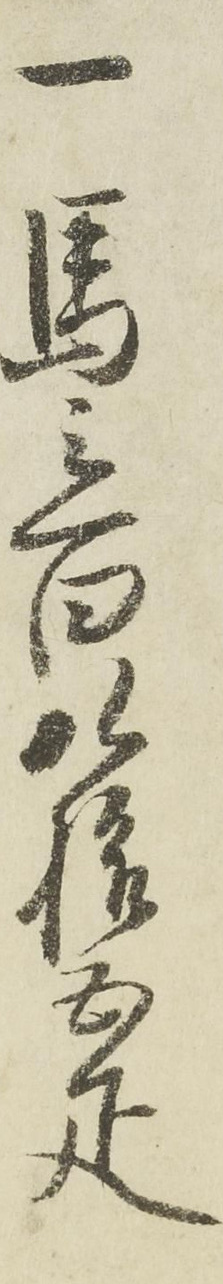一馬三百八拾五疋
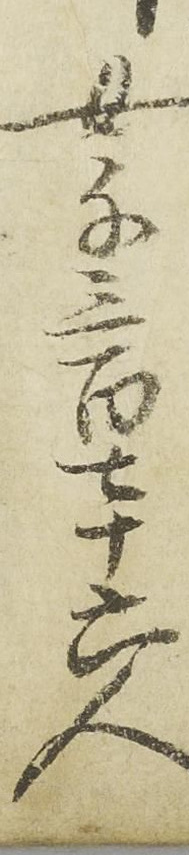女千三百七十六人
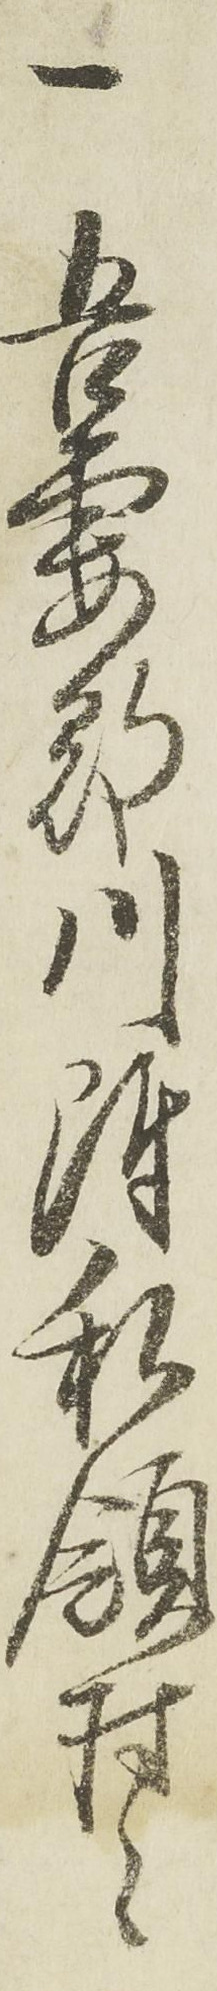一吾妻郡川附私領村々
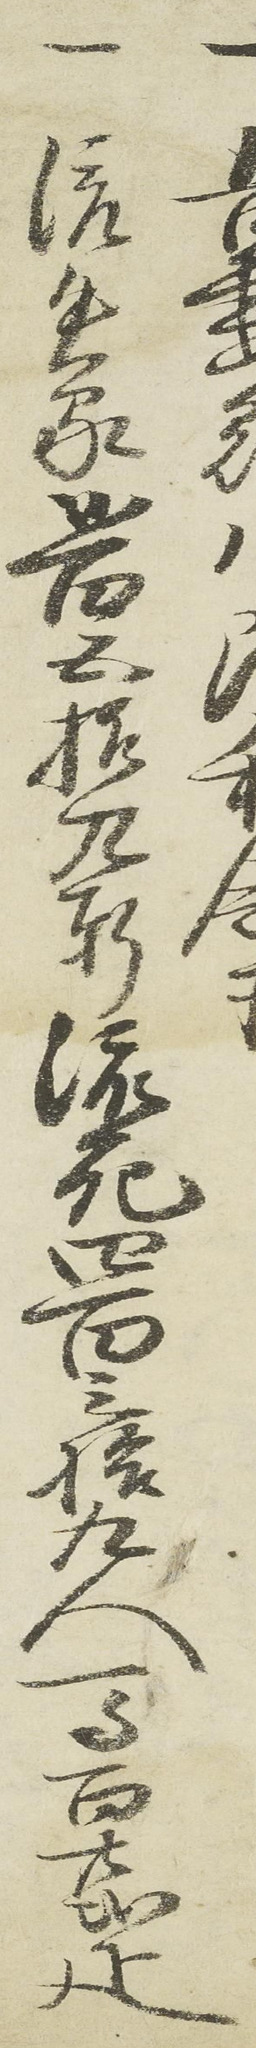一流失家弐百五拾九軒流死四百三拾九人馬百廿二疋
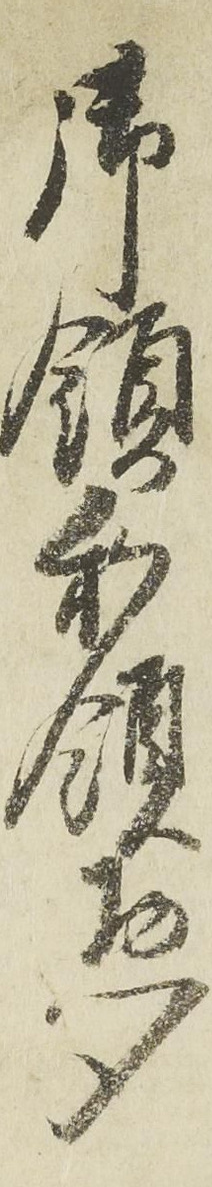御領私領惣〆
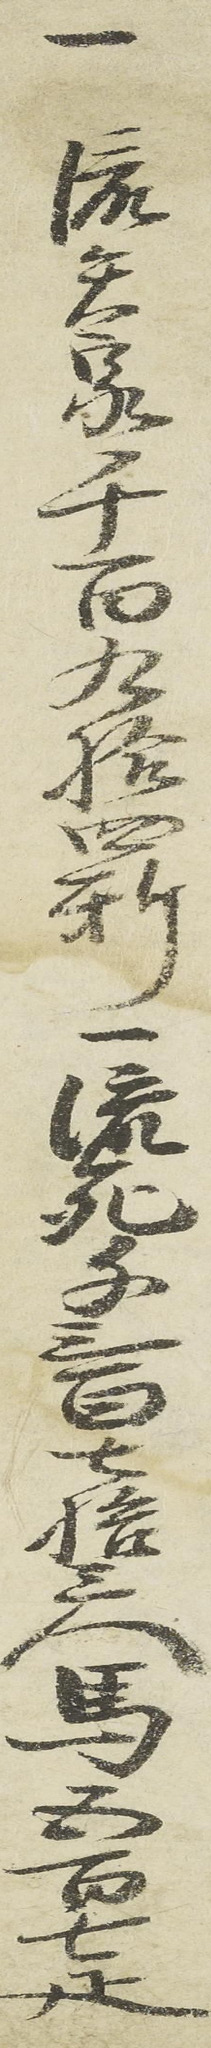一流失家千百九拾四軒一流死千三百七拾三人馬五百七疋
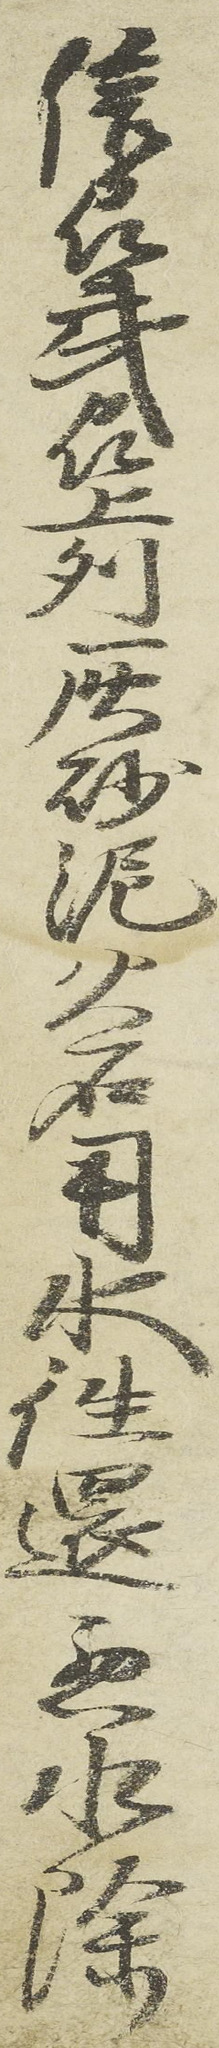信州武州上州灰砂泥火石用水往還悪水除
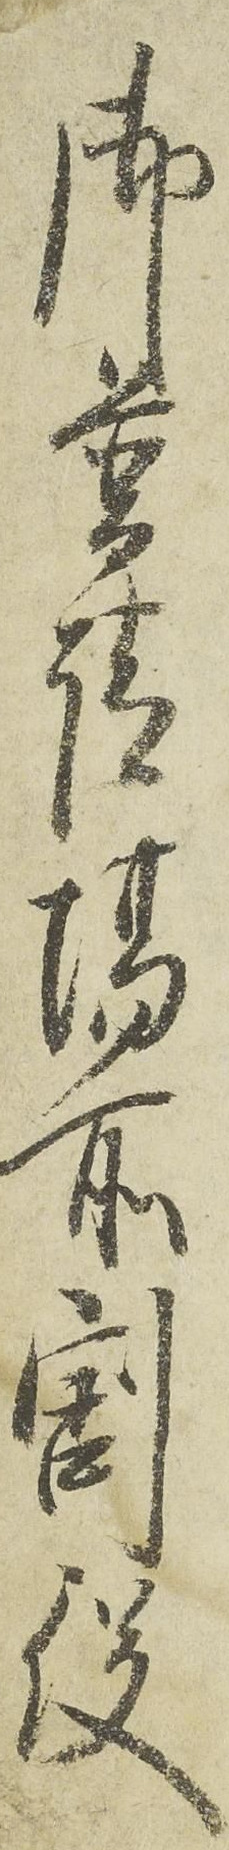御普請場所割役

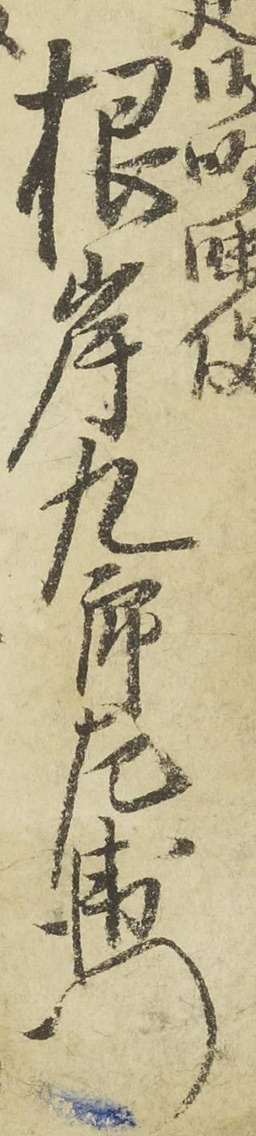根岸九郎左衛門
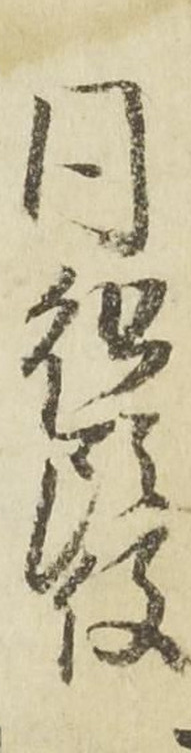同組頭役
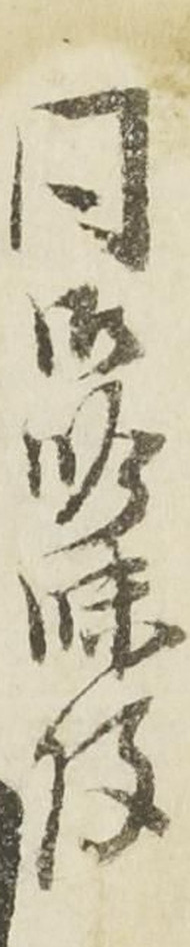同御吟味役
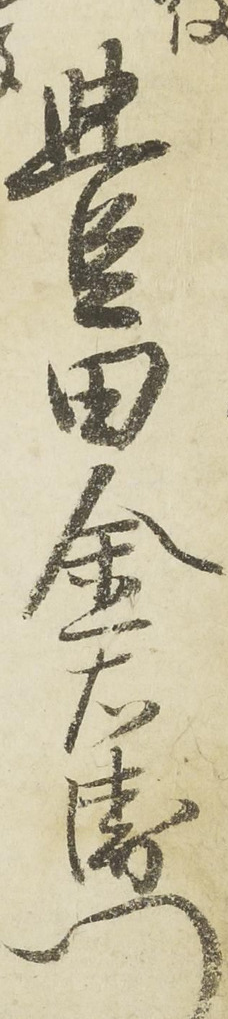豊田金右衛門
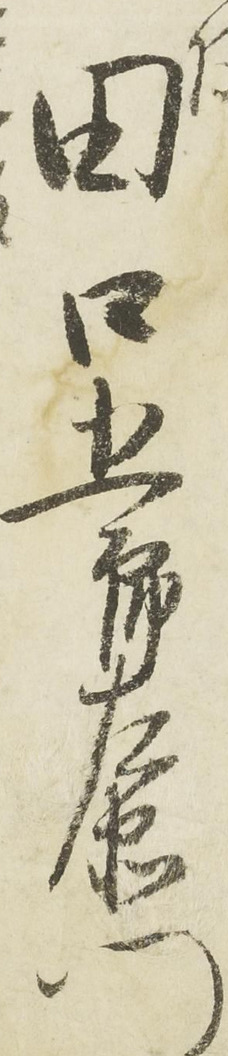田口五郎左衛門
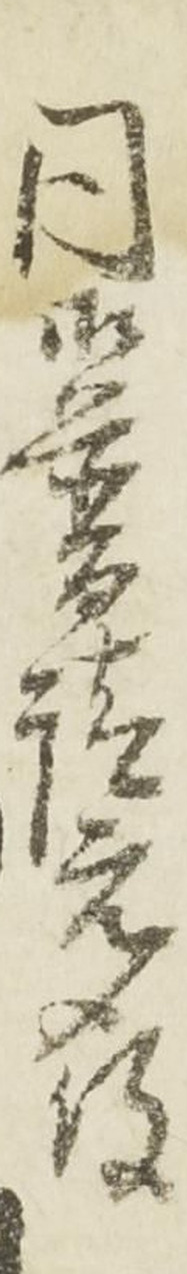同御普請元〆役
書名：浅間大変略記
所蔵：東京大学地震研究所図書室 Earthquake Research Institute Library, The University of Tokyo, JAPAN
